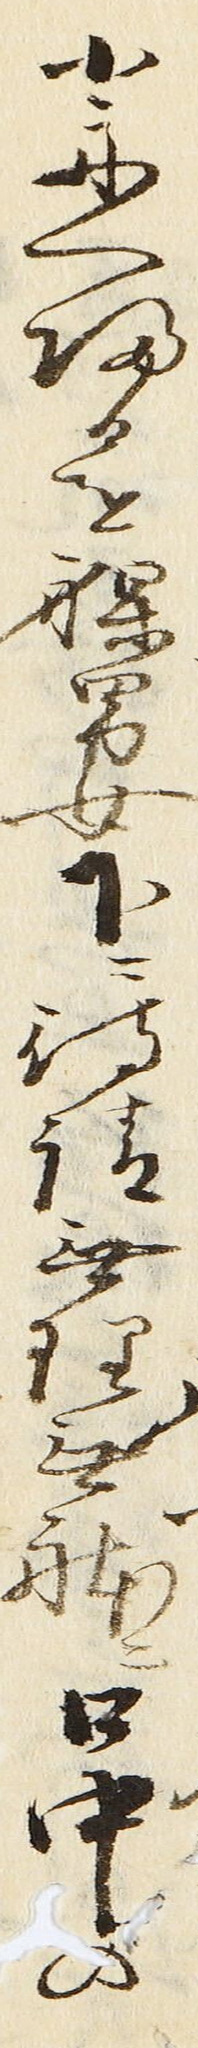小舟へ帰るを裸男女下ニ待請無理無体ニ口中の
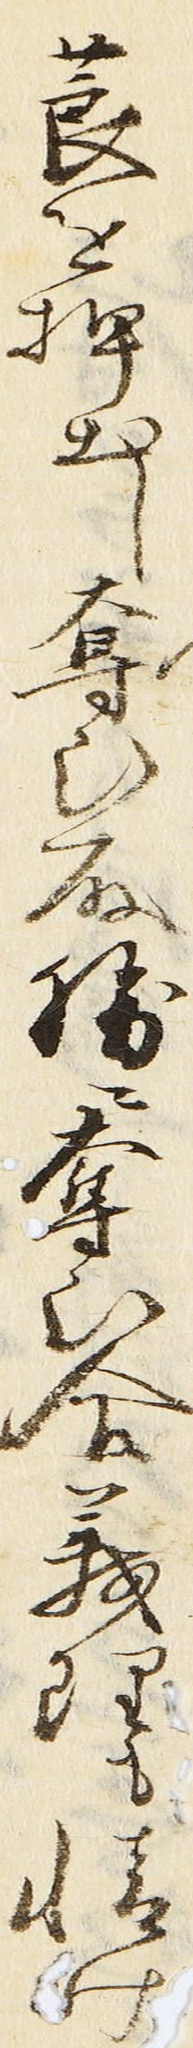莨を押出し奪ひ取勝ニ奪ひ合義理も情け
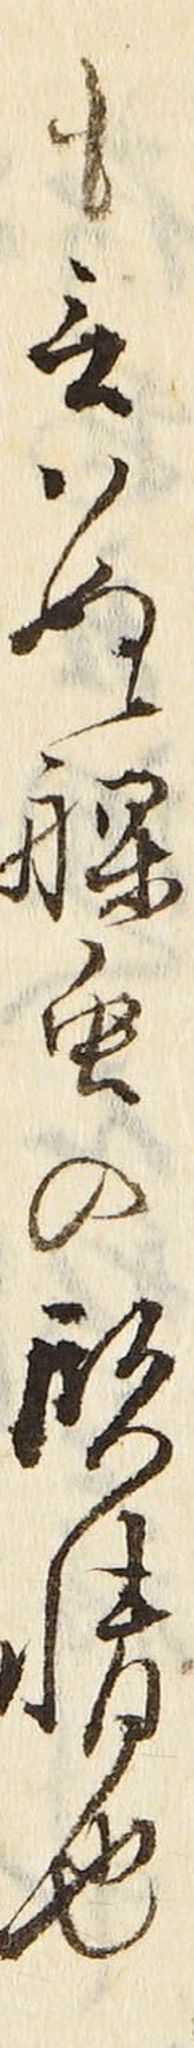も言はぬ裸ノ虫の形情也
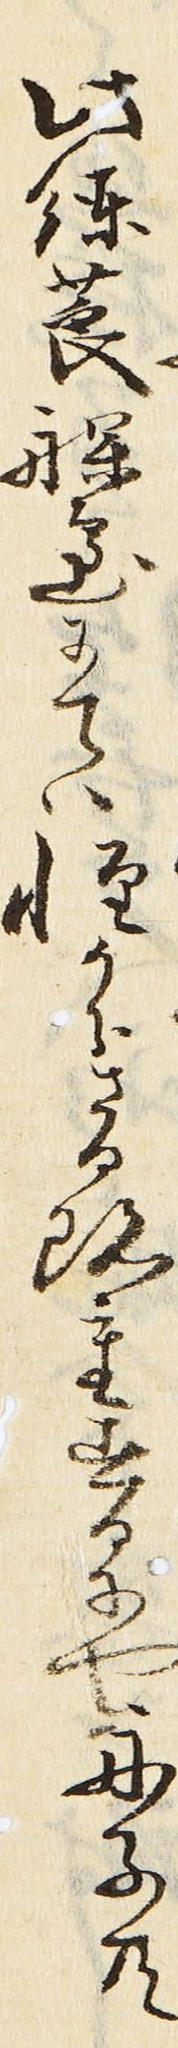此練莨裸島にてハ軽からさる珍重するにや舟子共
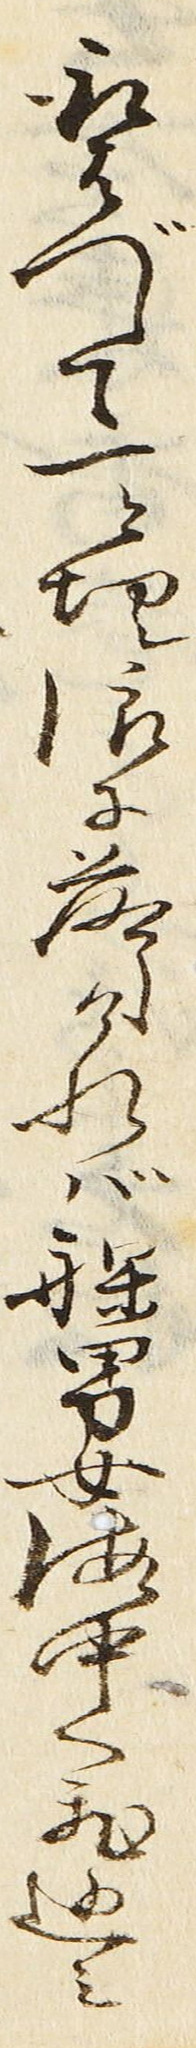取はづして一と切レ浪に落しけれバ裸男女海中へ飛込ミ
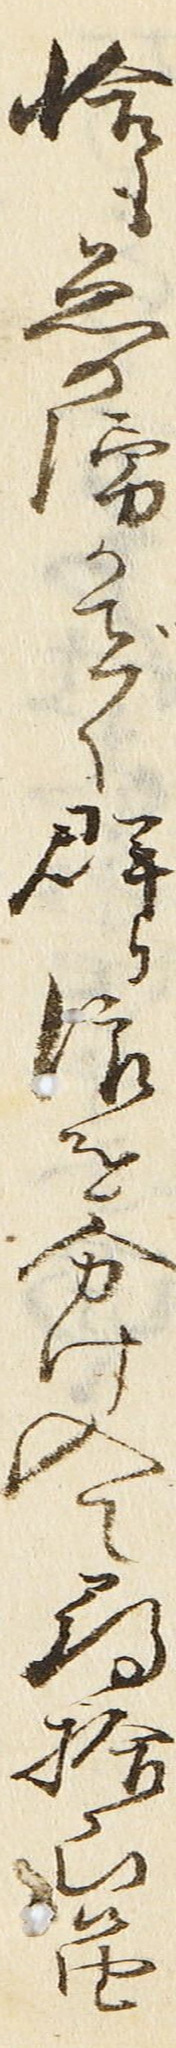恰も魚の湧かごとく群り浪を分け入て尋拾ひ候由
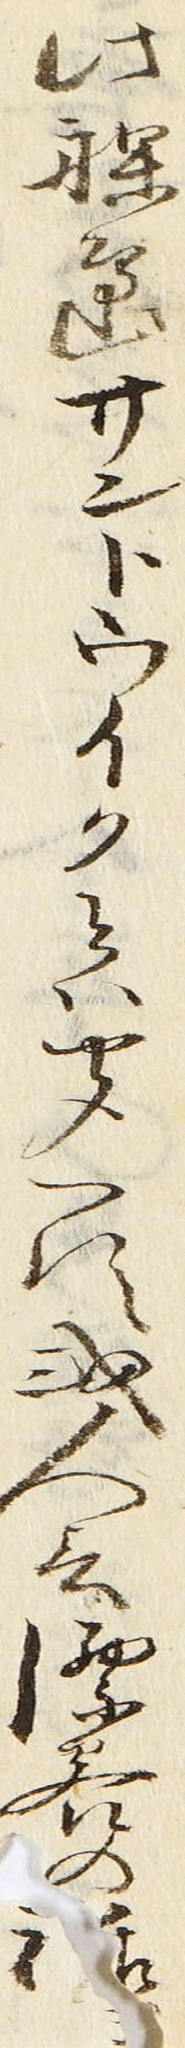此裸島サントウイクとハ聞へす或人言漂客の話
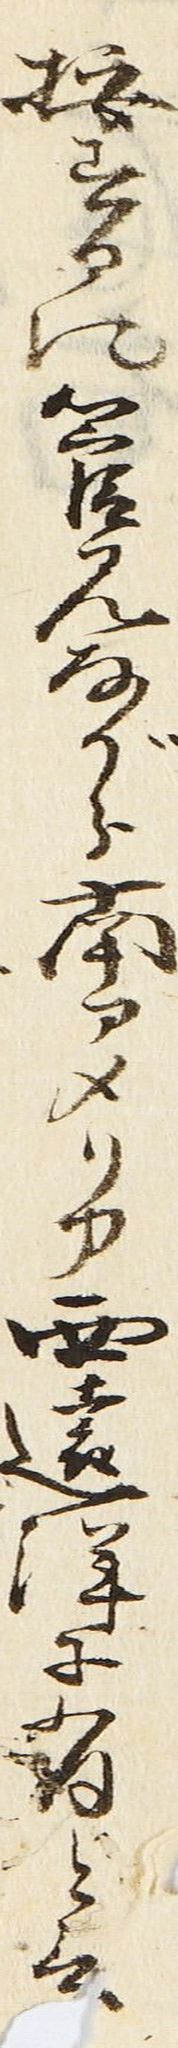按するに管見ながら南アメリカ西遠洋に有と言
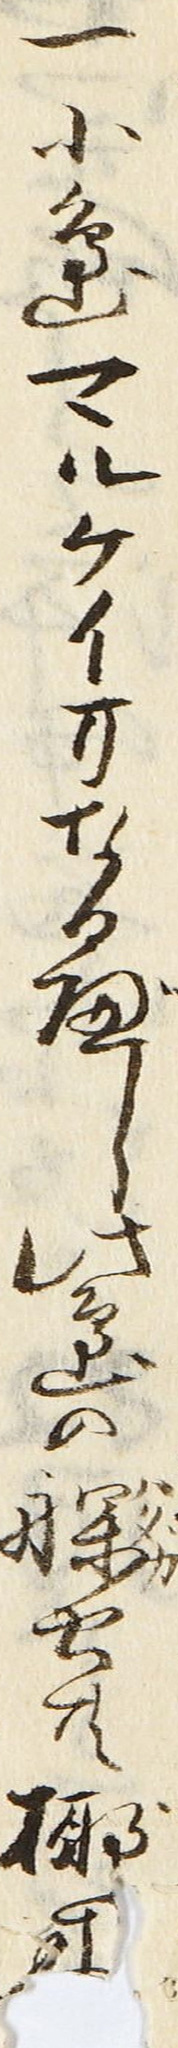一小島マルケイサなるべし此島の裸虫共椰木
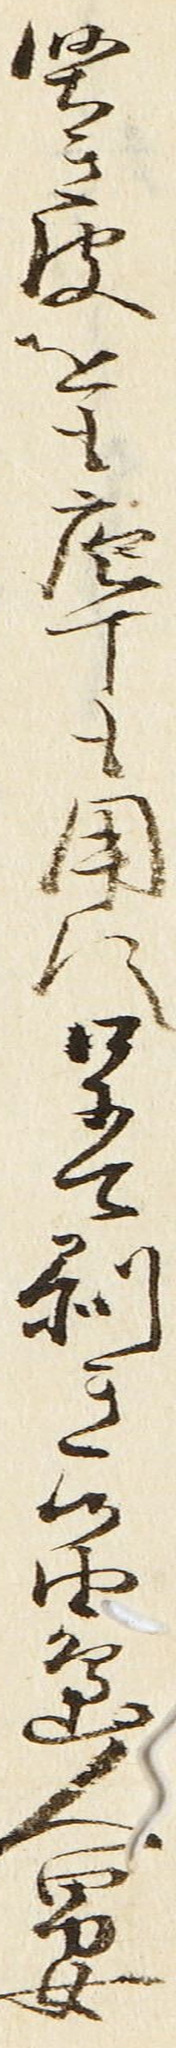堅き皮をも庖丁も用す口にて剥き候由島人男女
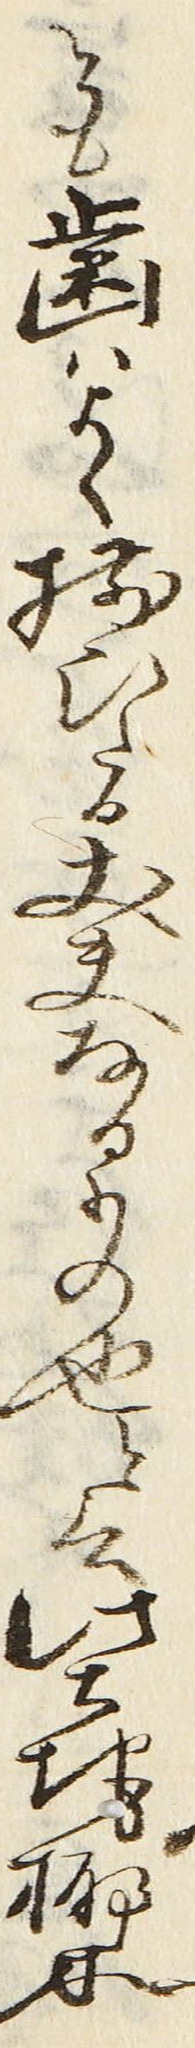とも歯ハよく揃ひたる丈夫なるもの也と言此土地椰木
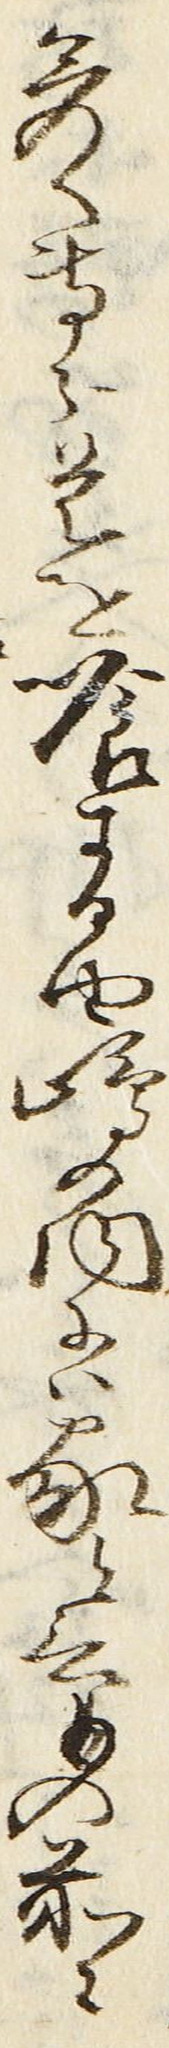多く専ら是を喰する由島の内にハ家と言もの前々
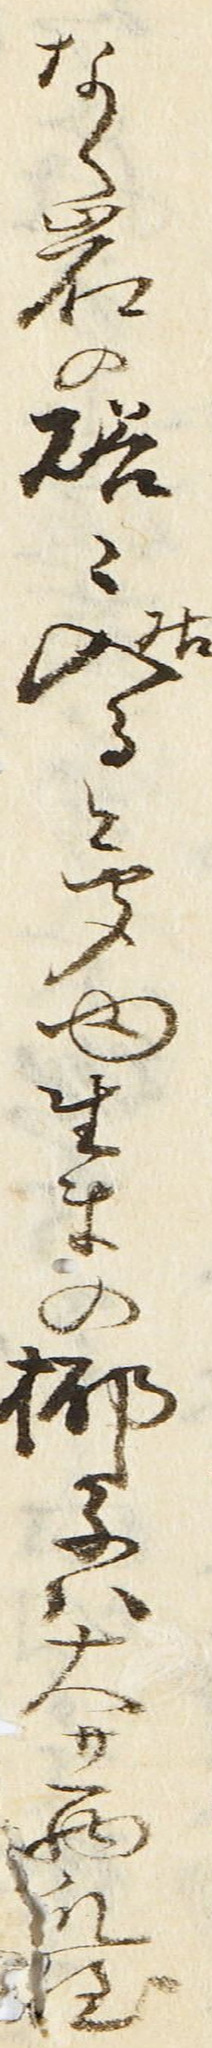なく岩の硲ニ居入ると聞ゆ生まの椰子ハ大サ西瓜程
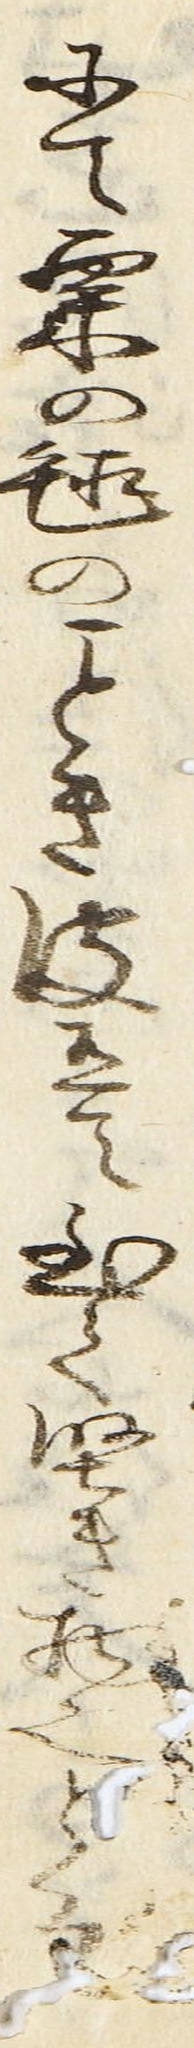にて栗の毬のことき皮有て至て堅き物也と
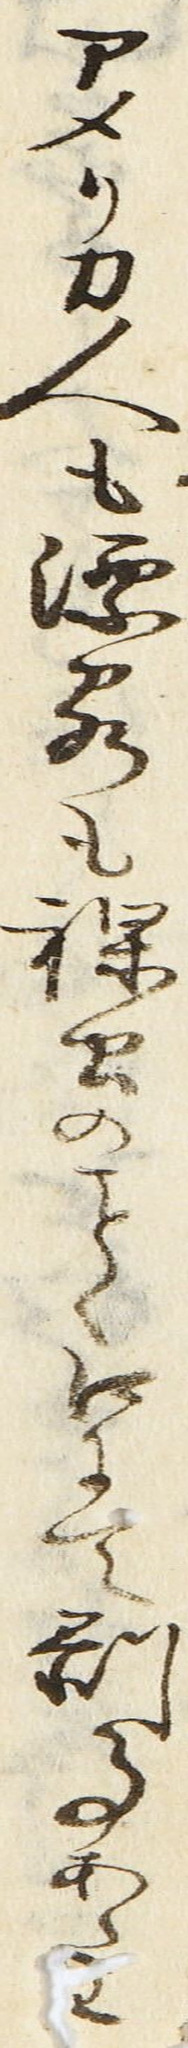アメリカ人も漂客も裸虫のことく口にて剥事あ
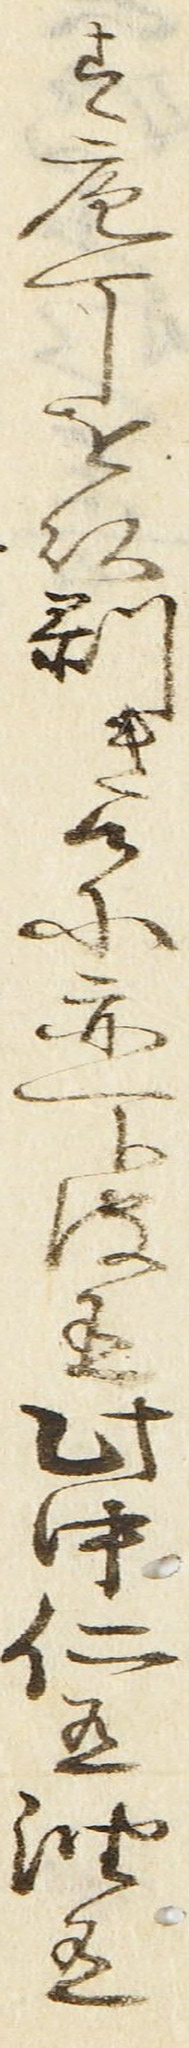す庖丁を以剥き候に亦一ト皮有此中仁有油有
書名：亜墨利加漂流記聞
